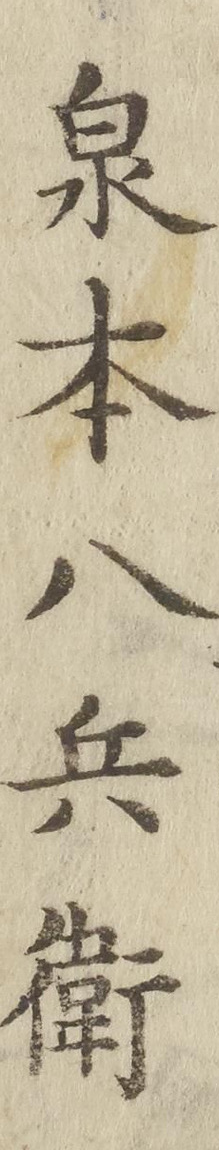泉本八兵衛
